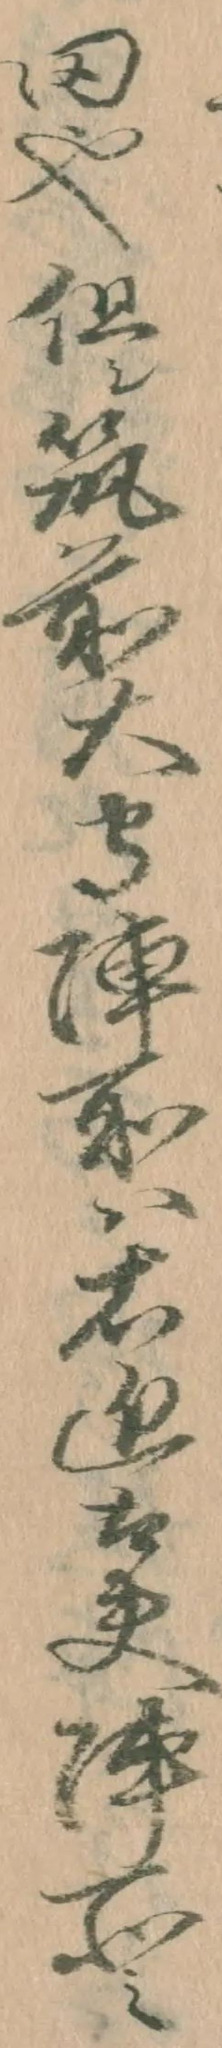田也但し筑前大守陣所は右近太夫陣所之
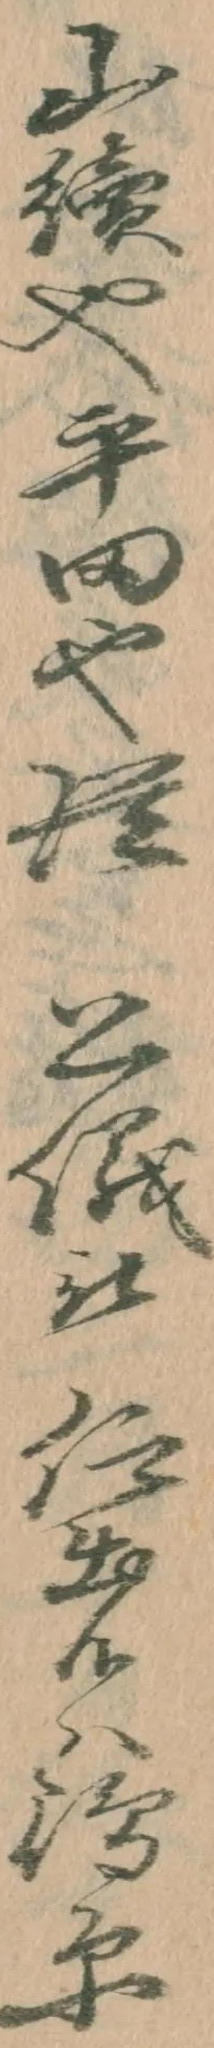山続也平田也従公儀被仰出候は島原
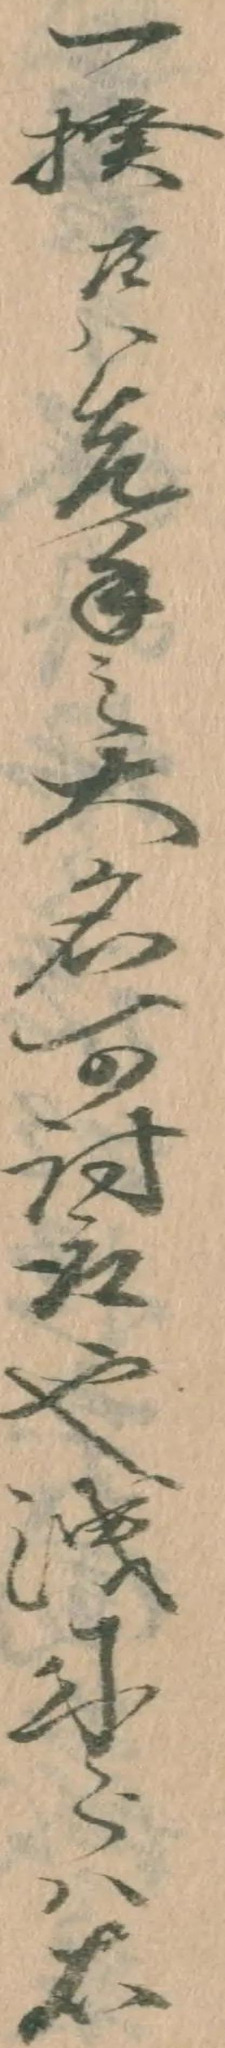一揆共は先手之大名可討取也洩来らは右
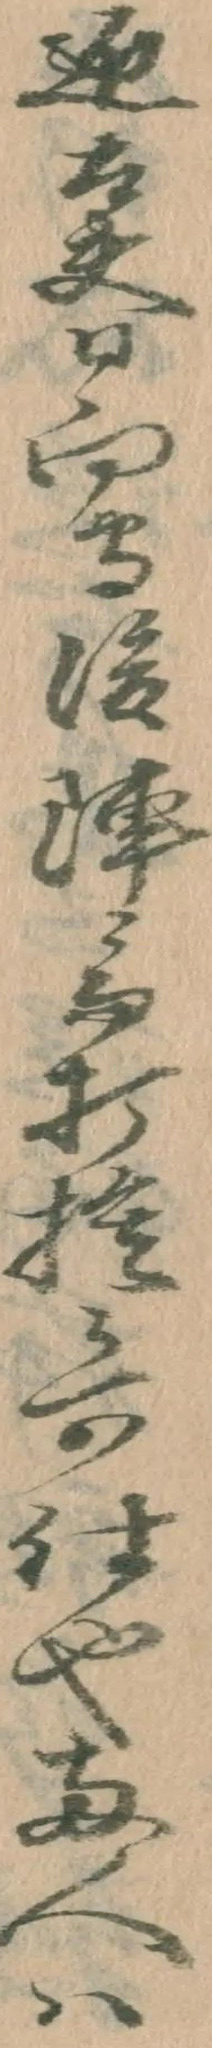近太夫日向守後陣に而打捨に可仕也両人は
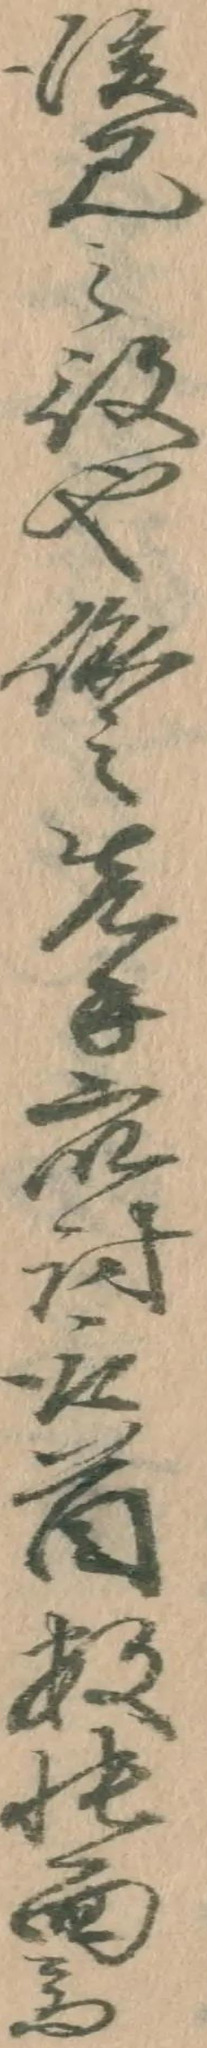後見之役也依之先手衆討取首数帳面に而
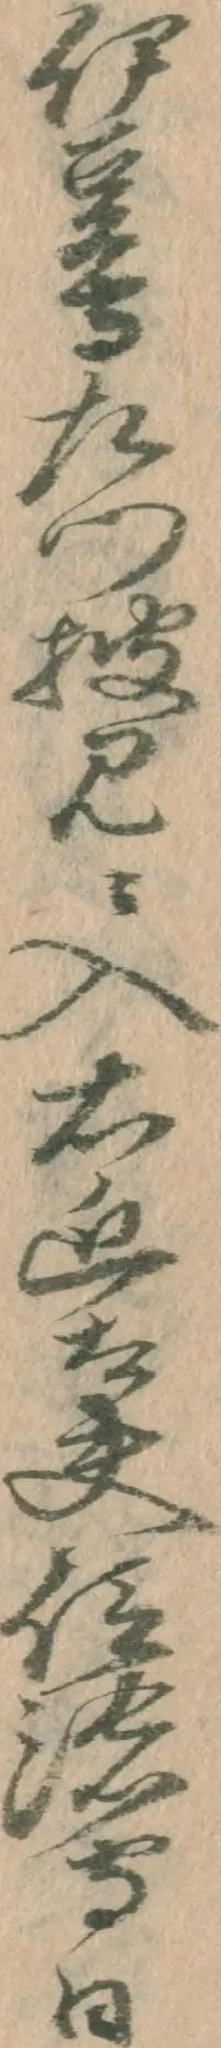伊豆守左門披見に入右近太夫信濃守日
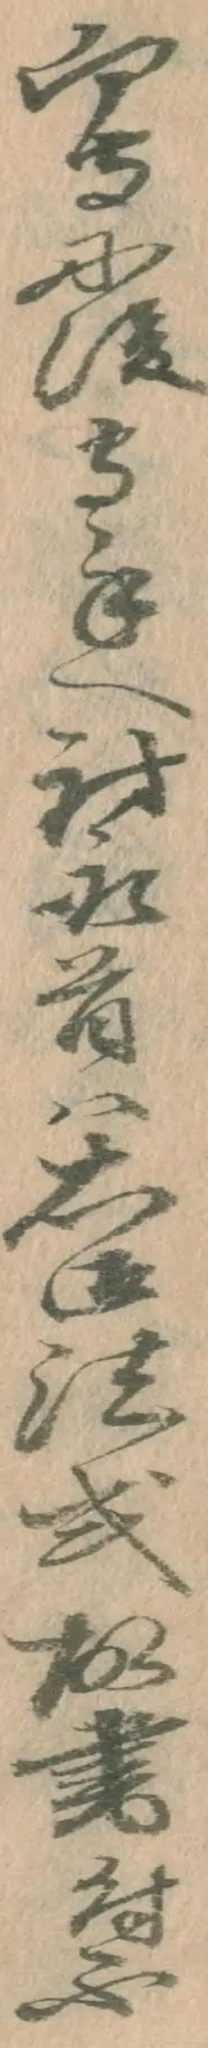向守丹後守手へ討取首は右御法式故書付ふ
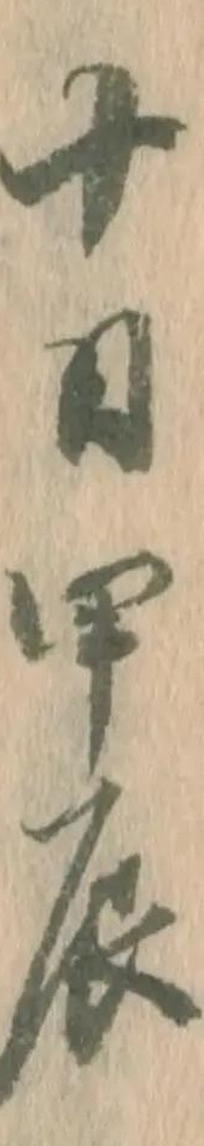十日甲辰
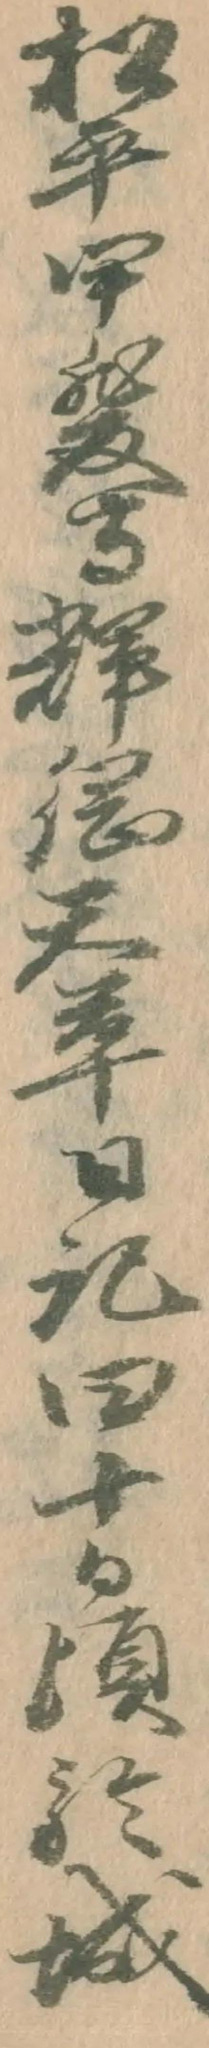松平甲斐守輝綱天草日記曰十日頃於城

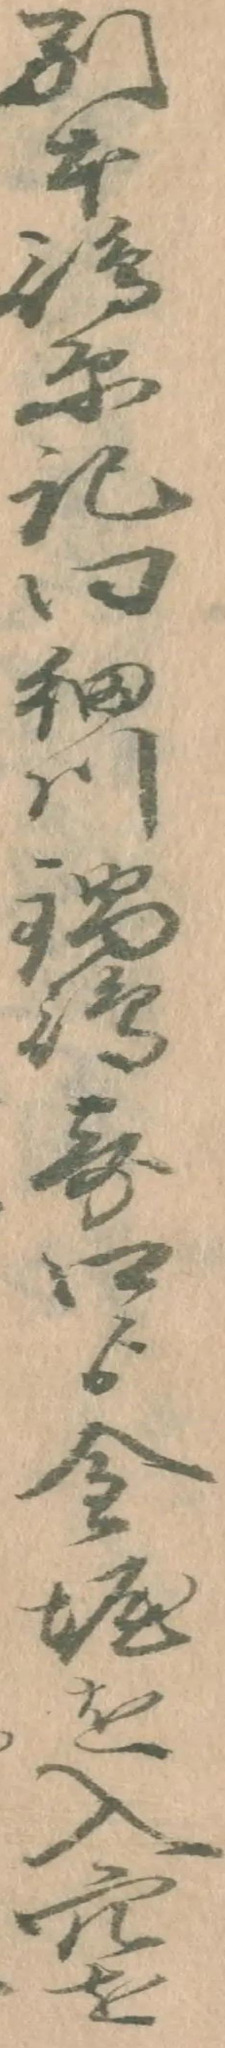別本島原記曰細川鍋島寄口ゟ金堀を入穴を
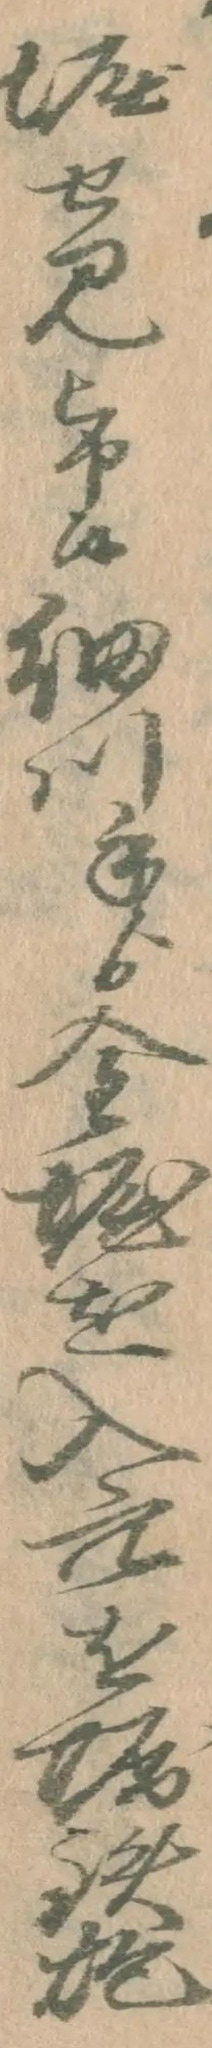堀せ見被申候細川手ゟ金堀を入穴を堀鉄炮
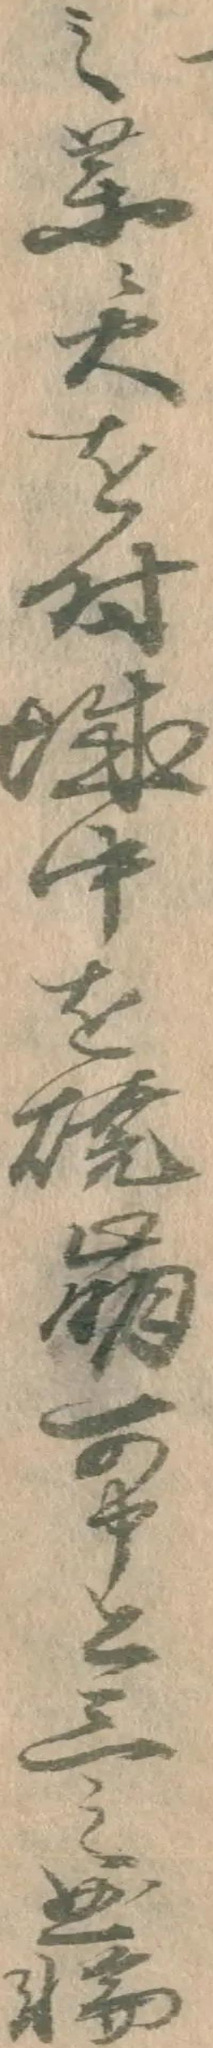之薬に火を付城中を焼崩可申と三之曲輪
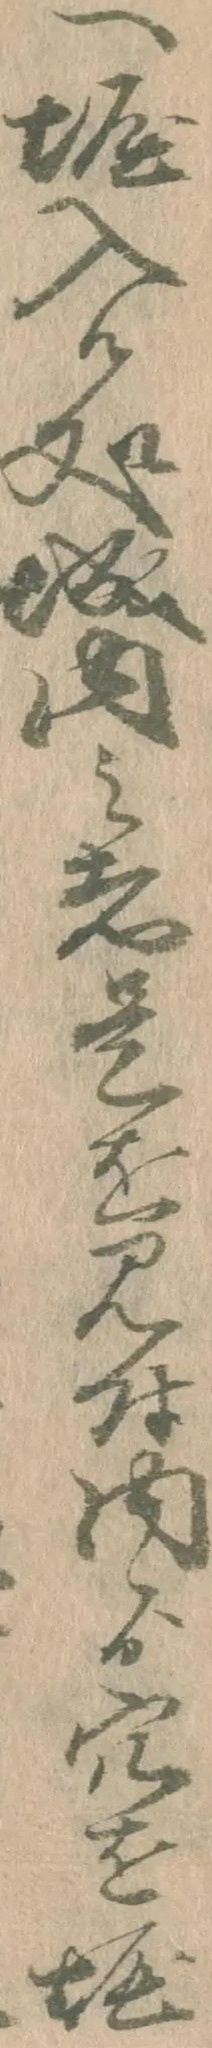へ堀入候処城内之者是を見付内ゟ穴を堀
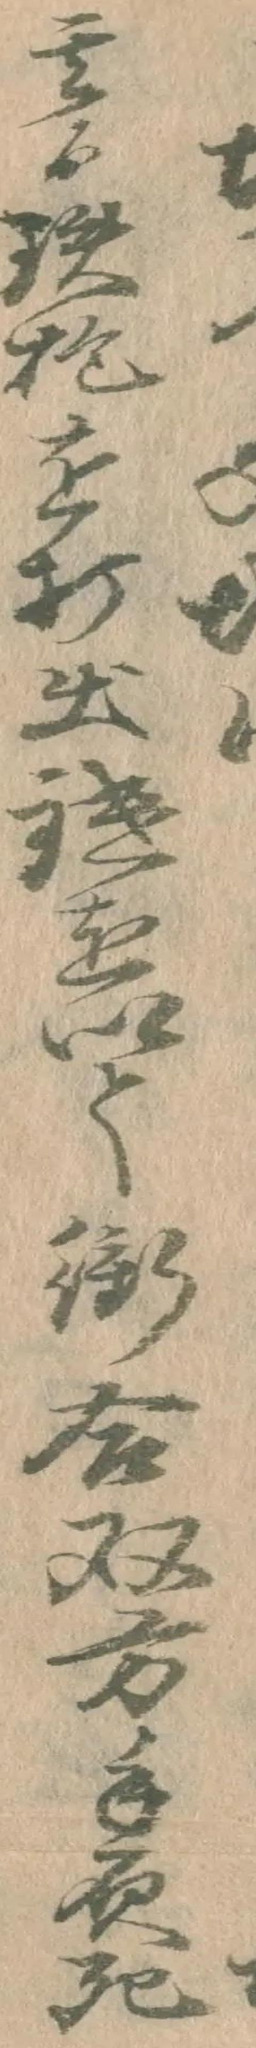其ゟ鉄炮を打出鑓を以て衛合双方手負死
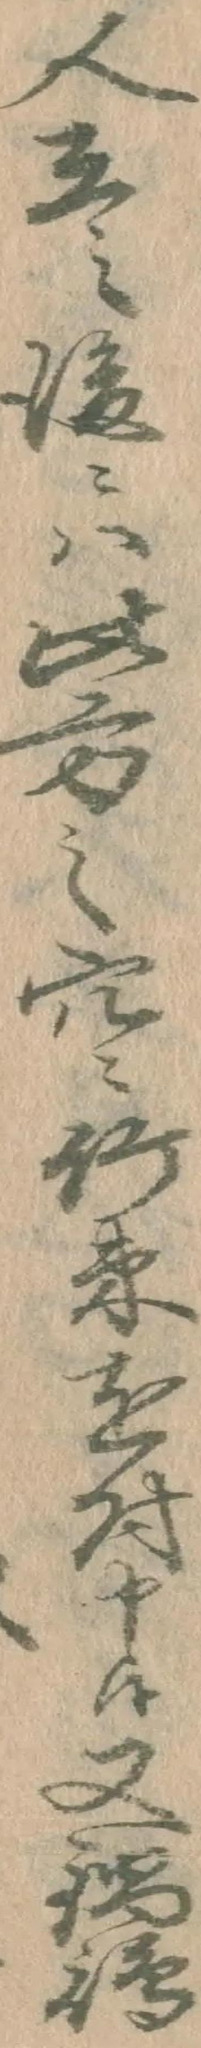人在之後には此方之穴に竹束を付申候又鍋島
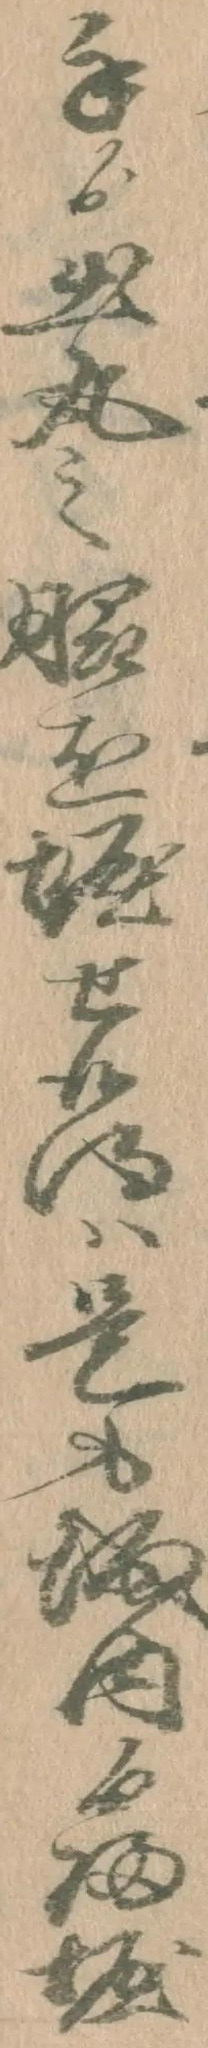手ゟ出丸之脇を堀せ候得は是も城内ゟ帰堀
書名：切支丹御退治記 49巻. [6]
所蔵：国立国会図書館 National Diet Library, JAPAN
